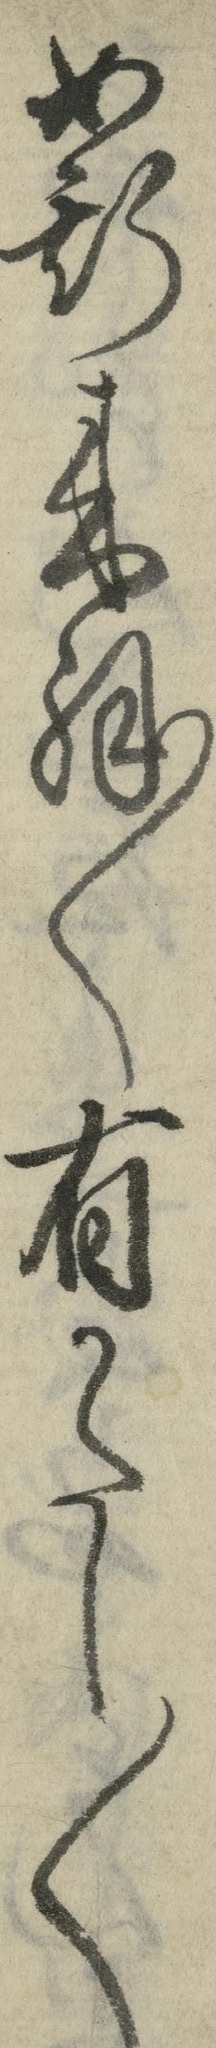如斯来拝〳〵有かたし〳〵
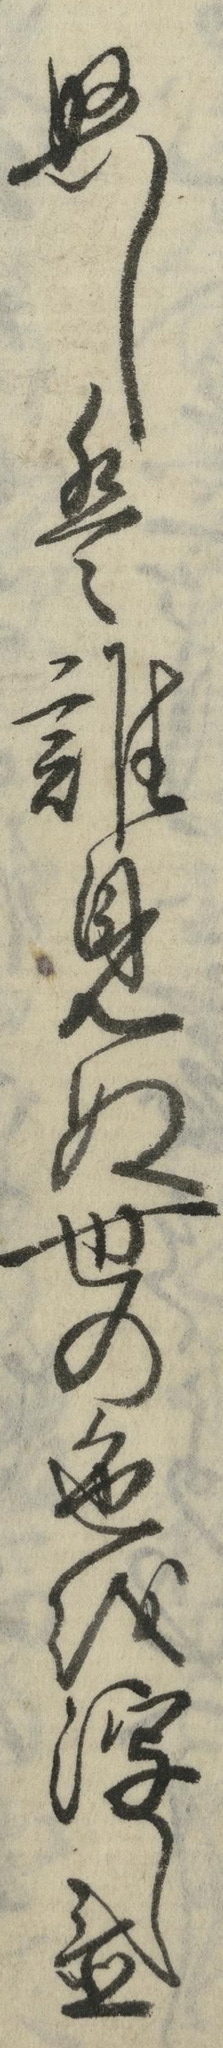ぬしは誰見ぬ世の色を瀉し置
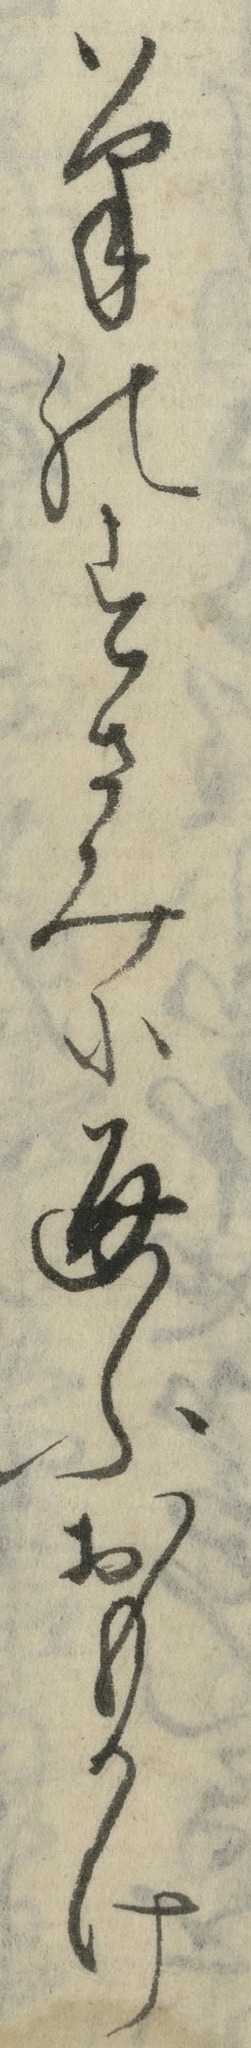筆のすさみに通ふおもかけ
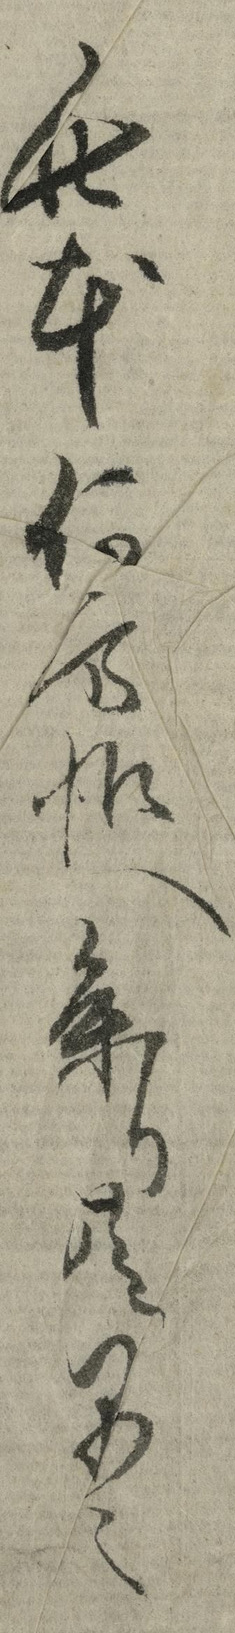此本何方様へ参り共早々
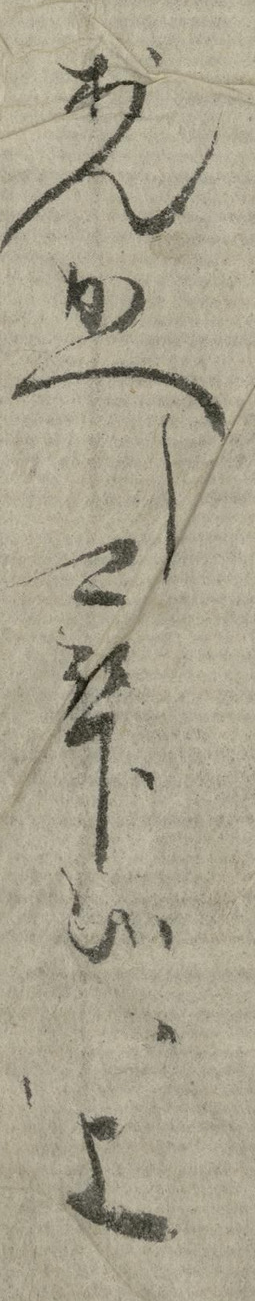ほんかへし可被下候上
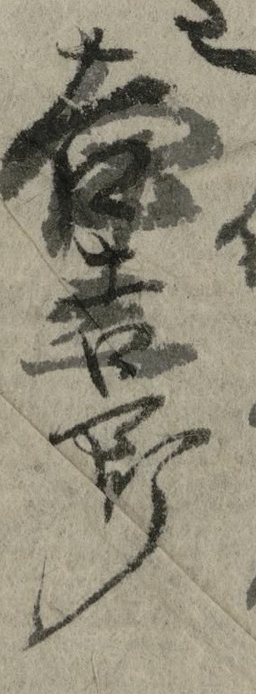吉吉郎
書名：浅間記
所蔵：東京大学地震研究所図書室 Earthquake Research Institute Library, The University of Tokyo, JAPAN
